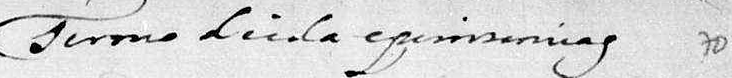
Termo de ida e penitencias
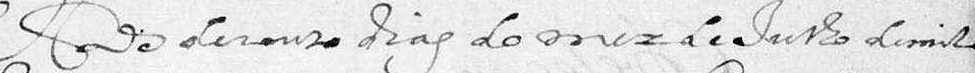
Aos dezouto dias do mez de Iulho de mil
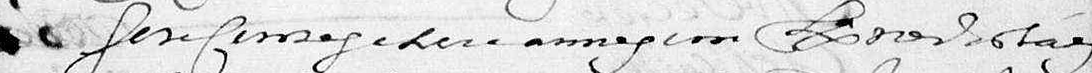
seteCentos e treze annos em Lxa nos estaos
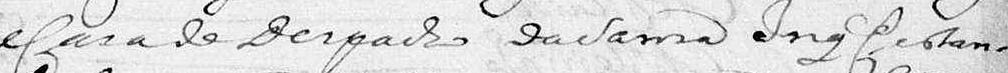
e Caza do Despacho da Santa Inq.çaõ estan
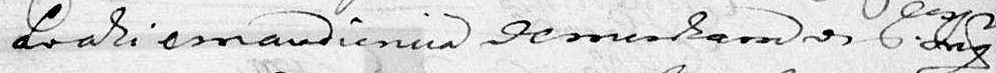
do ahi em audiencia de menham os d.os sr.es Inq.res
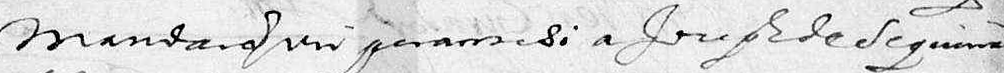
mandaraõ vir perante si a Jozeph de Sequeira
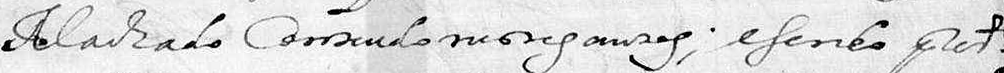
Machado Conteudo nestes autos; e sendo pres.te
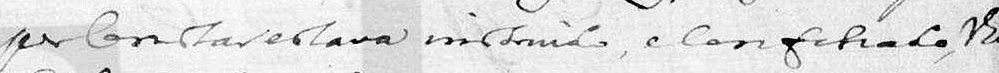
por Constar estava instruido, e Confessado, lhe
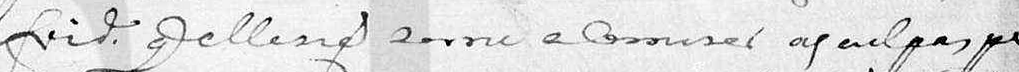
foi d.o q̄ elle naõ torne a Cometer as culpas por
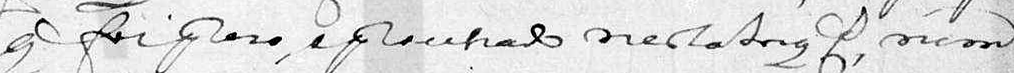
q̄ foi prezo, e processado nesta Inq.çaõ, nem
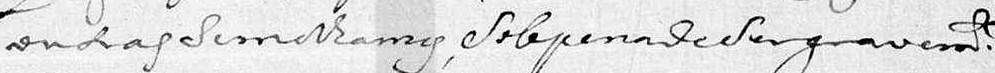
outras semelhantes, sob pena de ser gravem.te
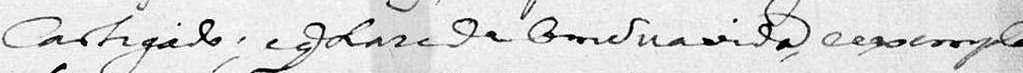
Castigado; e q̄ trate da bom sua vida, e exemplo
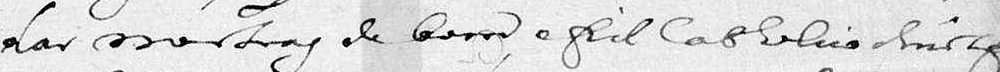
dar mostras de bom, e fiel Catholico christaõ
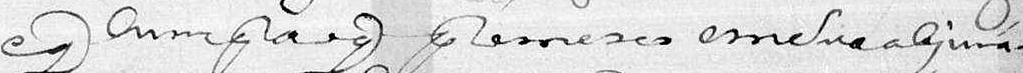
e q̄ Cumpra o q̄ prometeo em sua abjura
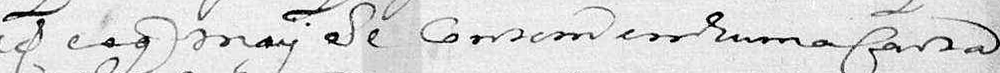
çaõ e o q̄ mais Se contem em huma Carta
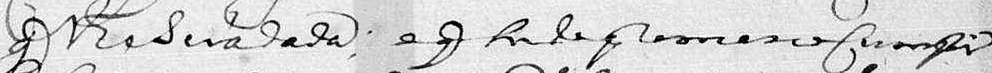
q̄ lhe Será dada: e q̄ hinda prometeo Cumprir
